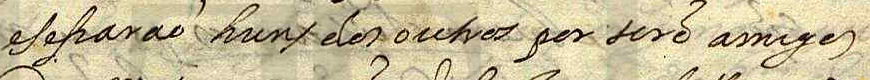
e se fiaraõ huns dos outros por serē amigos
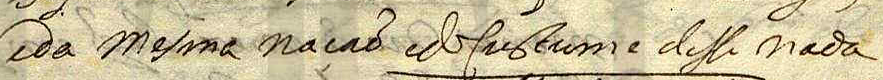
e da mesma nacaõ e do Custume disse nada
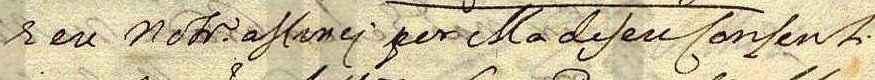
E eu notro assinej por ella de seu Consenti
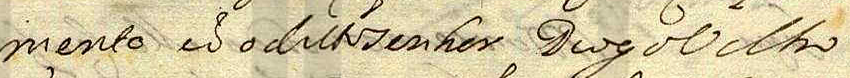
mento cō o ditto senhor Diogo Velho
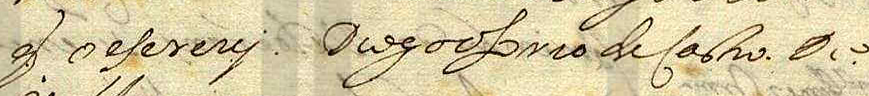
q̄ o escreuj. Diogo osorio de Castro. Di.o
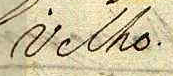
Velho.
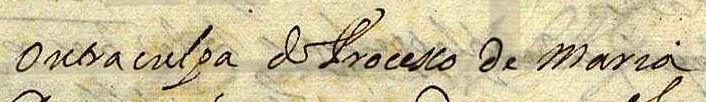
Outra culpa do Processo de maria
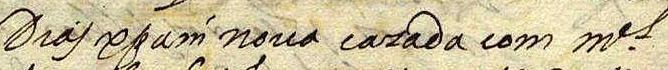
Dias xpam̄ noua cazada com m.el
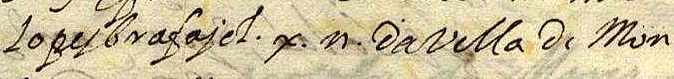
lopes brafajel. x. n. da villa de Mon
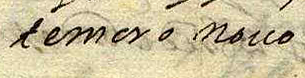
temor o nouo
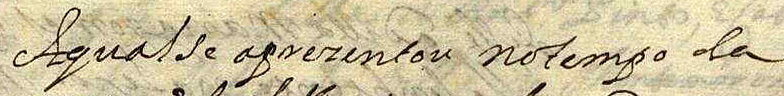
A qual se aprezentou no tempo da
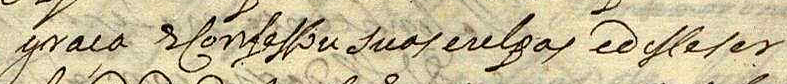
graça E Confessou suas culpas e disse ser
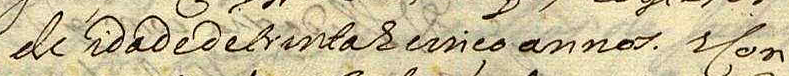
de idade de trinta E cinco annos. E Con
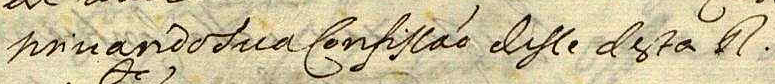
tinuando sua Confissão disse desta R.
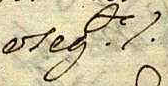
o seg.te /.
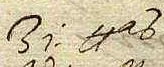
3i ttas
